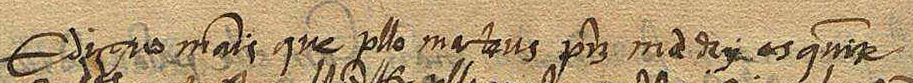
E diguo mais que pllo mateus pr̄z mādey os qūize
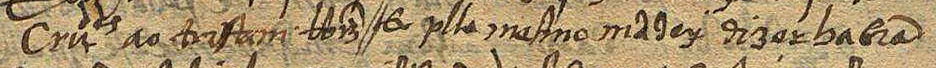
Crudos ao tristam Roiz̄ // E pllo mesmo mādey dizer ha brā
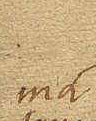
ma
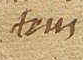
teus
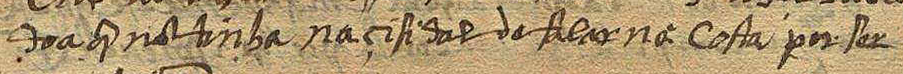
doa q̄ nō tinha nacisidal de falar na Costa por ser
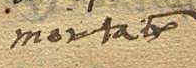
morta c̄ꝭ
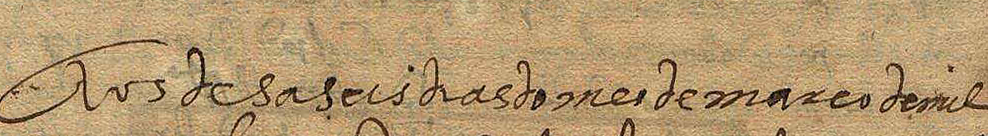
Aos desaseis dias do mes de março de mil
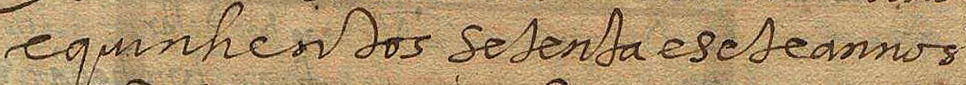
e quinhentos setenta e sete annos
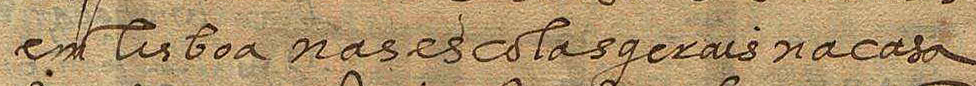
em lisboa nas escolas gerais na casa
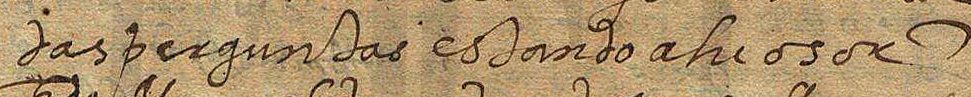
das perguntas estando ahi o sor̄
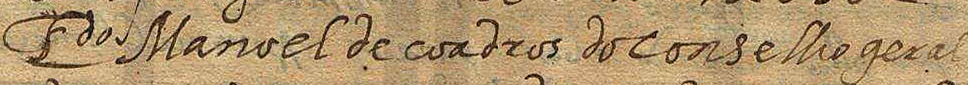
Ldo Manoel de coadros do conselho geral
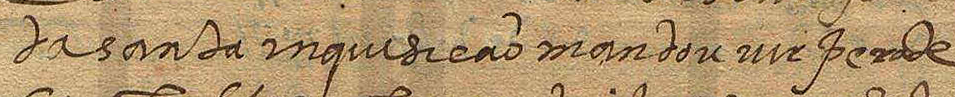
da santa inquisiçaõ mandou uir perāte
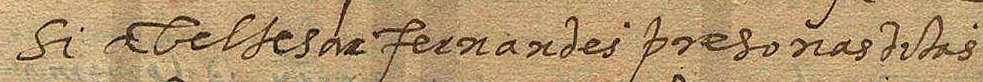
si a beltesar fernandes preso nas ditas
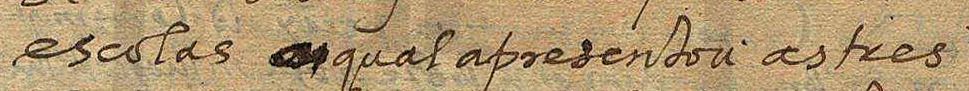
escolas o qual apresentou as tres
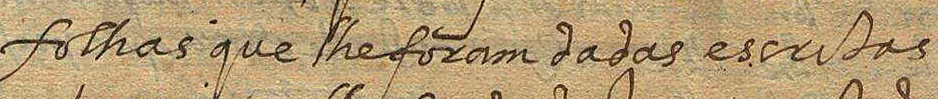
folhas que lhe foram dadas escritas
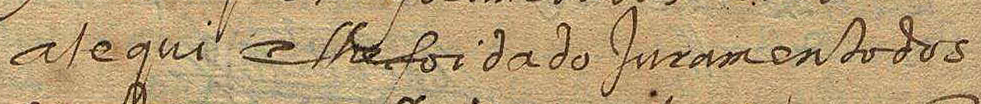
ate qui e lhe foi dado Juramento dos
